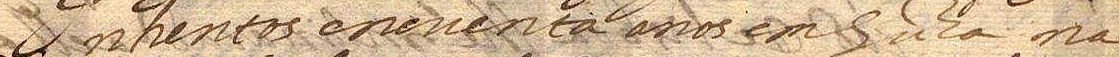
nhentos e nouenta anos em hūa na
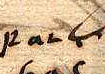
par
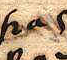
paS
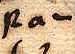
Ra.
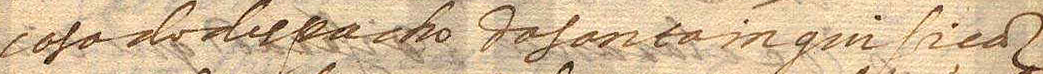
casa do despacho da santa inquisiçaõ
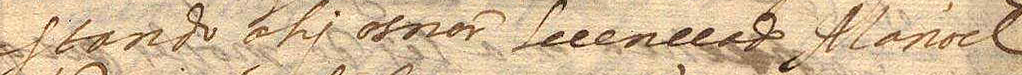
estando ahj o snor̄ lecençeado Manoel
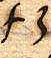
t 3
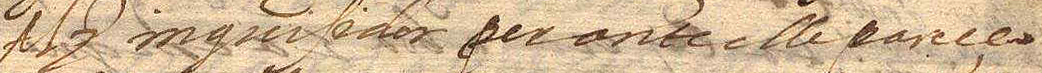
Alz̄ inquisidor perante elle pareçeo
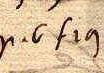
p. 6 t 19
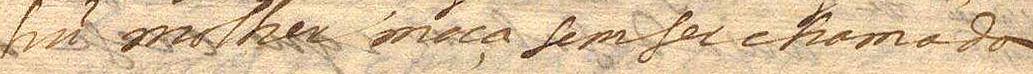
hū molher moça sem ser chamada
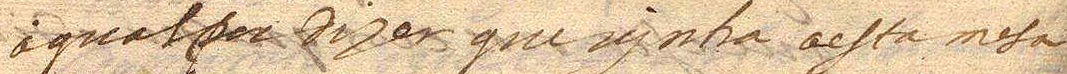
a qual por dizer que ujnha a esta mesa
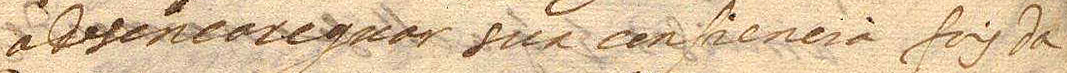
a desencareguar sua consiencia foy da
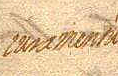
iuramento
